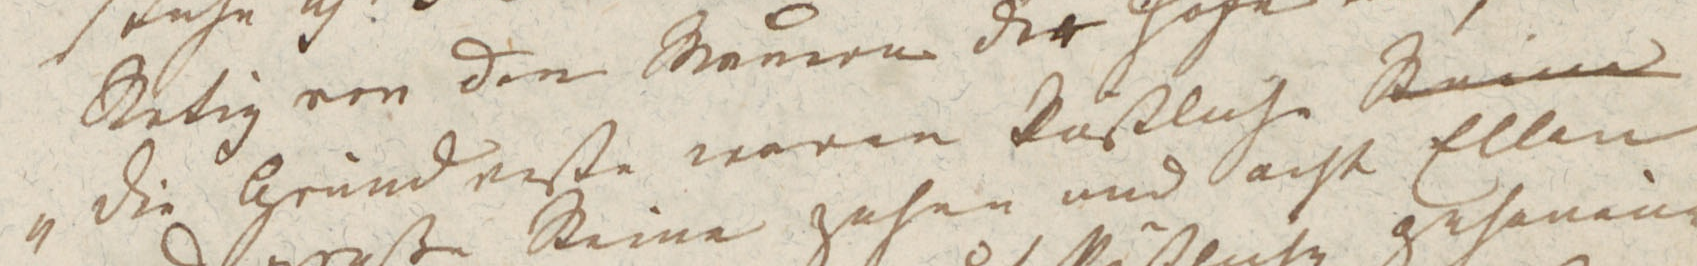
"Die Grundveste waren köstliche Steine
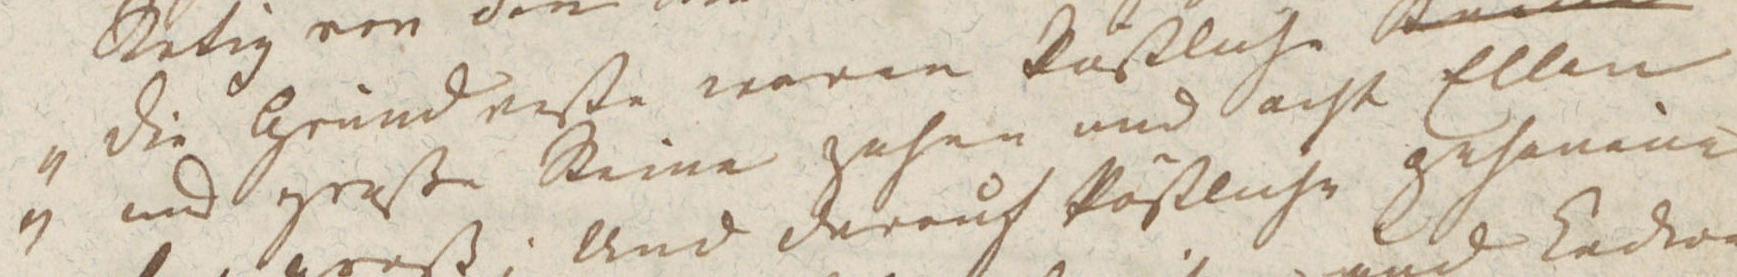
"und grosse Steine zehen und acht Ellen
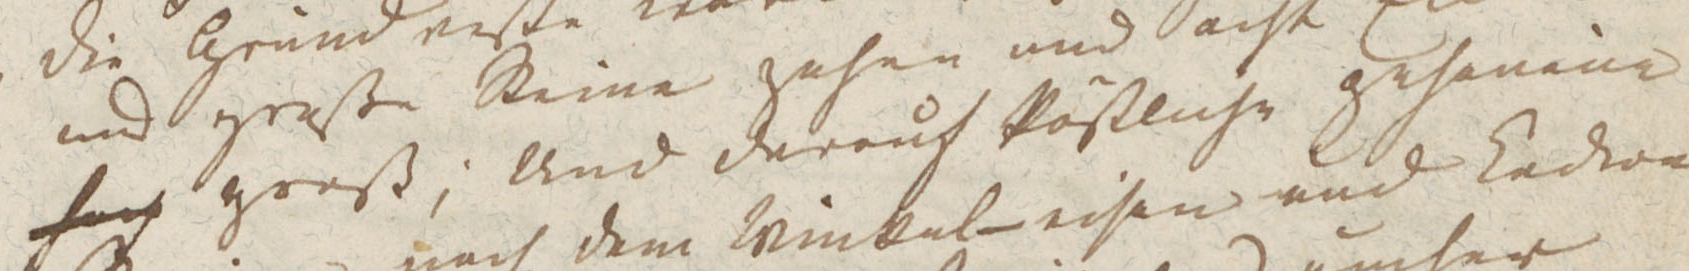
"hoch gross; Und darauf köstliche gehauene
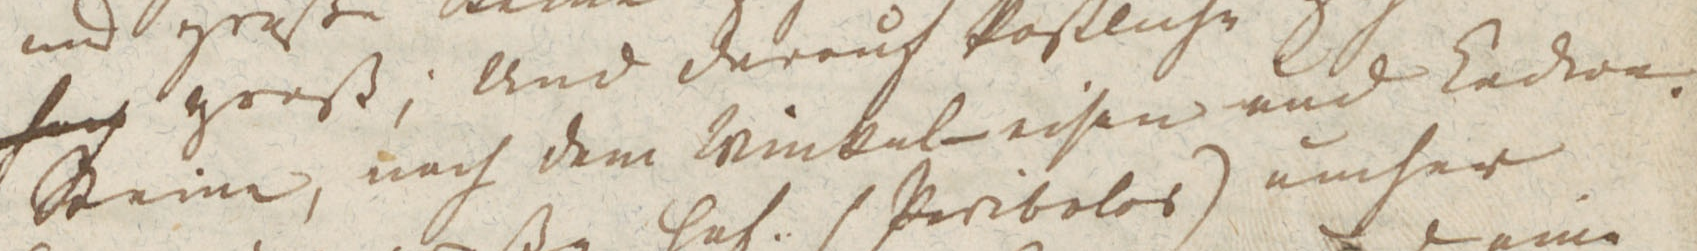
"Steine, nach dem Winkel-eisen und Cedern.
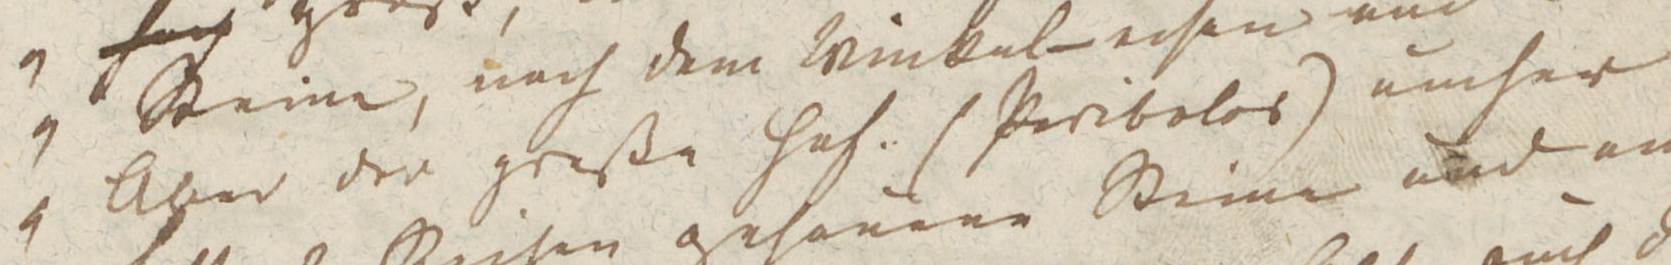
"Aber der grosse Hof (Peribolos) umher
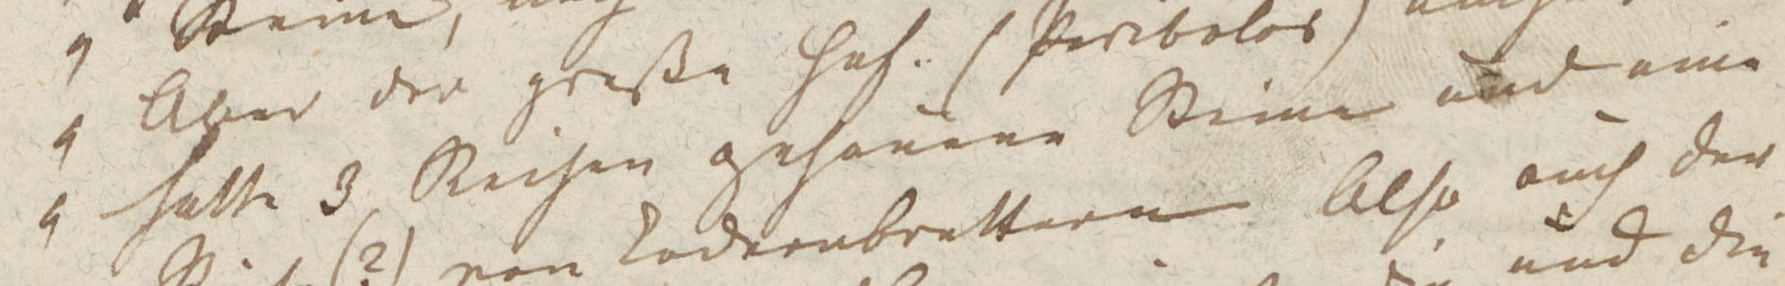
"hatte 3 Reichen gehauene Steine und eine
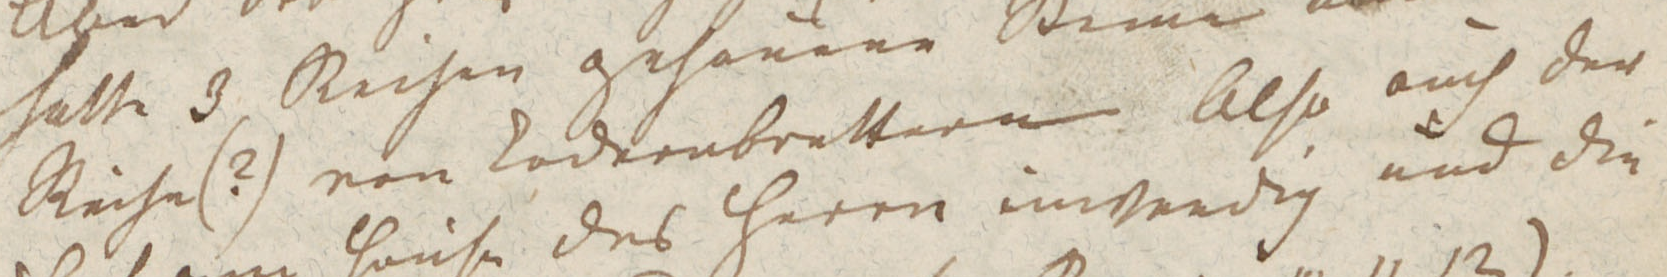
"Reiche (?) von Cedernbrettern. Also auch der
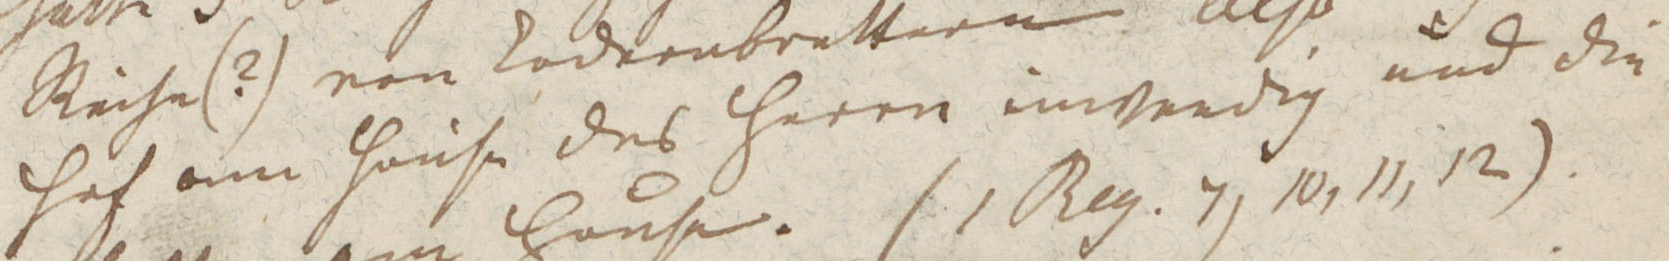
"Hof am Hause des Herrn inwendig und die
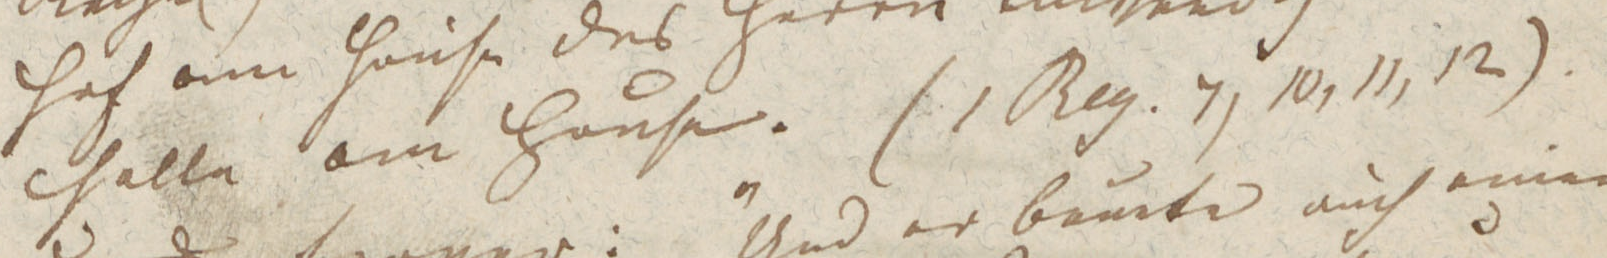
"Halle am Hause. (1 Reg. 7, 10, 11, 12).
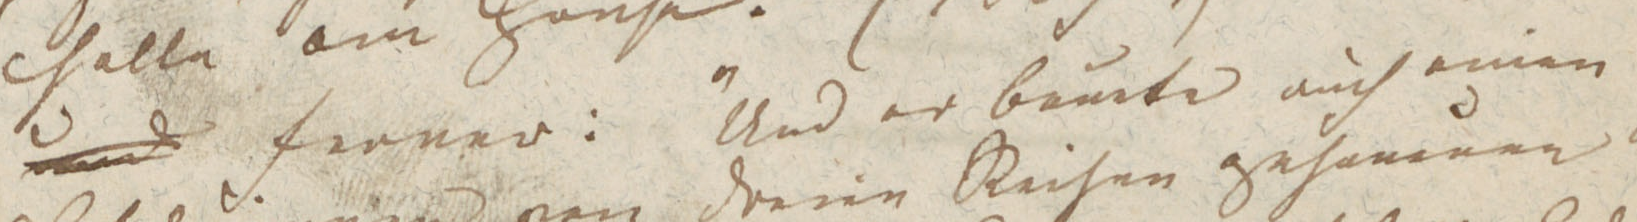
und Ferner: "Und er bauete auch einen"
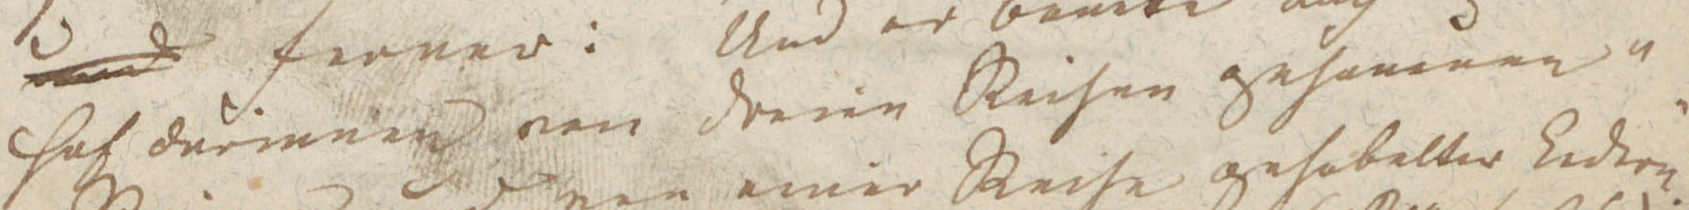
"Hof darinnen von dreien Reihen gehauenen"
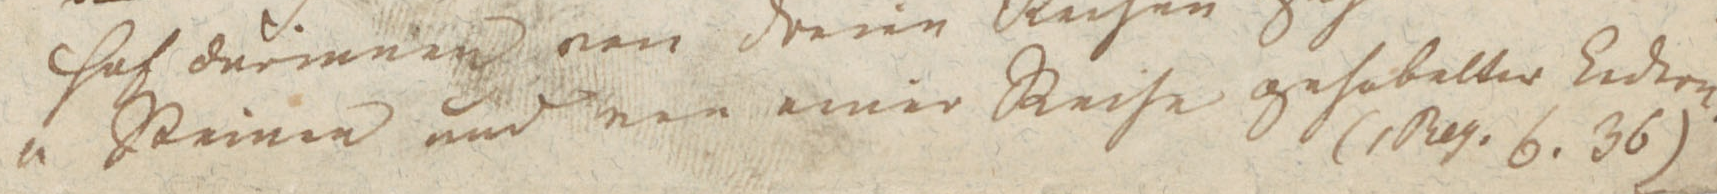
"Steinen und von einer Reihe gehobelter Cedern."
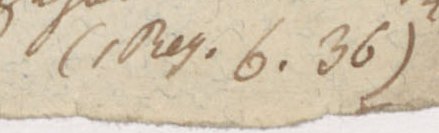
(1 Reg. 6. 36)
